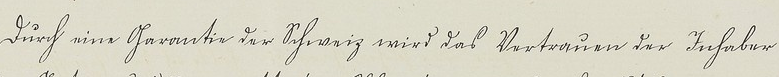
Durch eine Garantie der Schweiz wird das Vertrauen der Inhaber
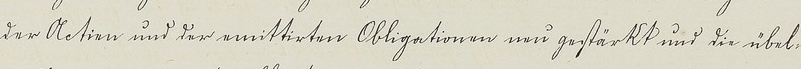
der Actien und der emittirten Obligationen neu gestärkt und die übel-
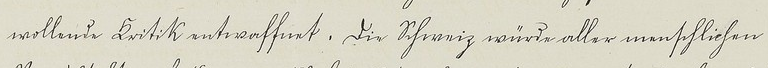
wollende Kritik entwaffnet. Die Schweiz würde aller menschlichen
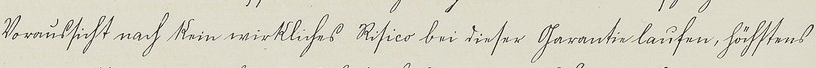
Voraussicht nach kein wirkliches Risico bei dieser Garantie laufen, höchstens
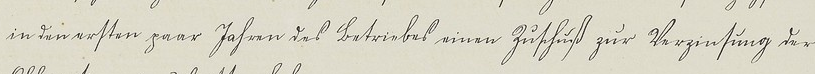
in den ersten paar Jahren des Betriebes einen Zuschuß zur Verzinsung der
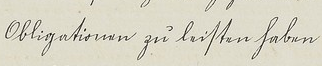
Obligationen zu leisten haben.
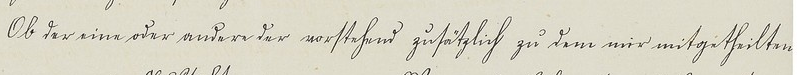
Ob der eine oder andere der vorstehend zusätzlich zu dem mir mitgetheilten
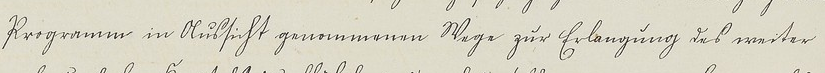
Programm in Aussicht genommenen Wege zur Erlangung des weiter
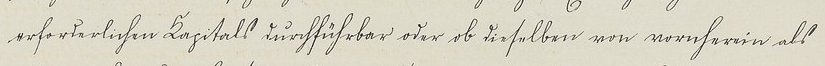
erforderlichen Kapitals durchführbar oder ob dieselben von vornherein als
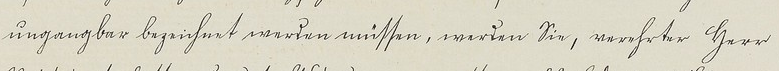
ungangbar bezeichnet werden müssen, werden Sie, verehrter Herr
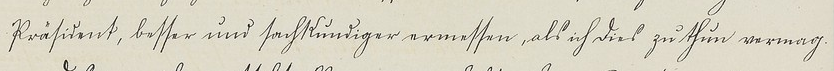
Präsident, besser und sachkundiger ermessen, als ich dies zu thun vermag.
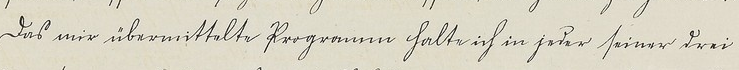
Das mir übermittelte Programm halte ich in jeder seiner drei
